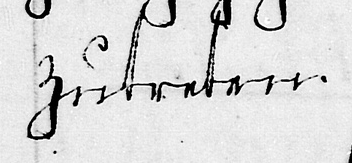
zutreten.
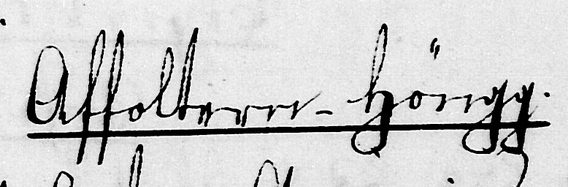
Affoltern-Höngg.
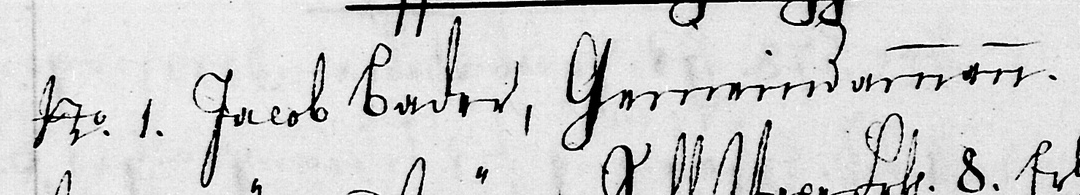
No. 1. Jacob Bader, Gemeindammann.
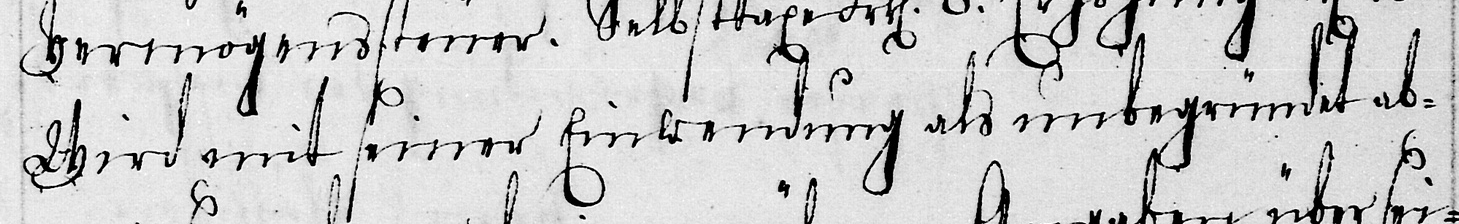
Wird mit seiner Einwendung als unbegründet ab¬
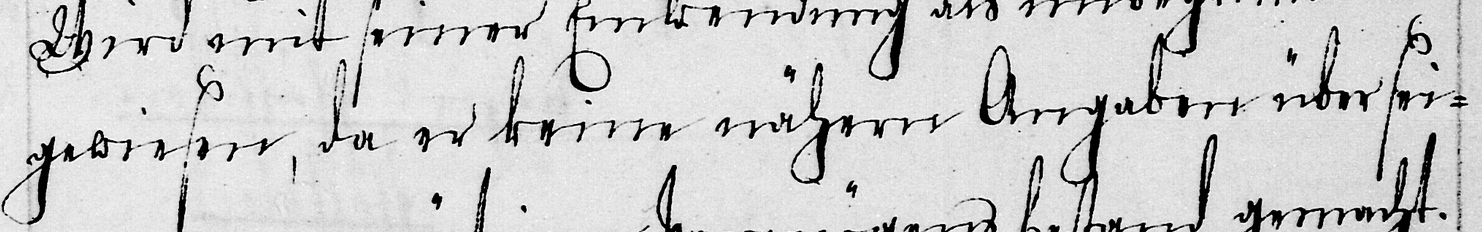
gewiesen, da er keine nähern Angaben über sei¬
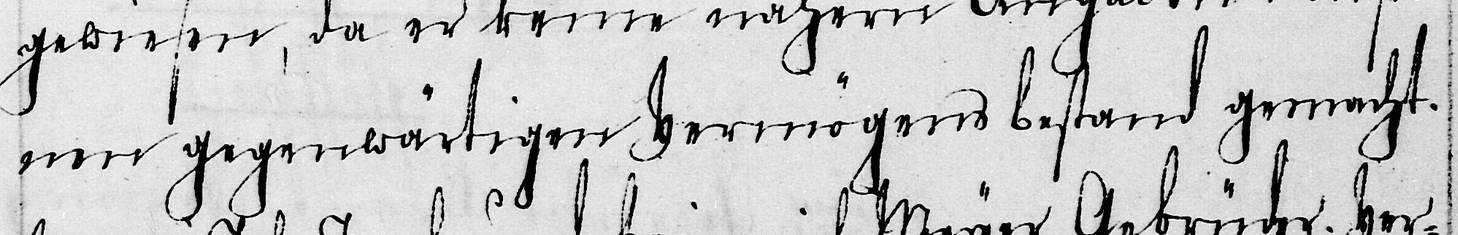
nen gegenwärtigen Vermögensbestand gemacht.
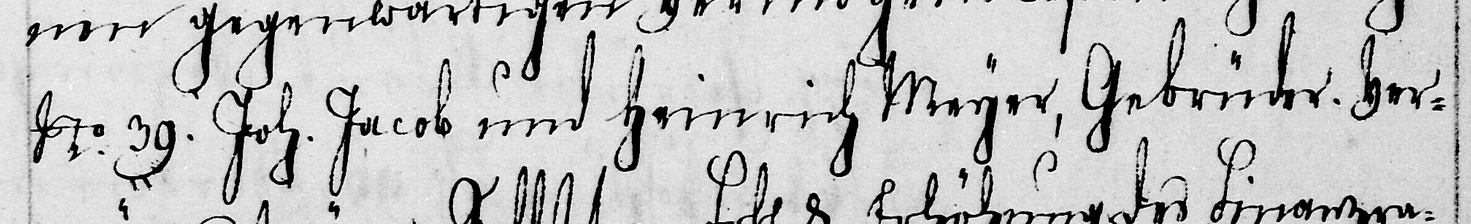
No. 39. Joh. Jacob und Heinrich Meyer, Gebrüder. Ver¬
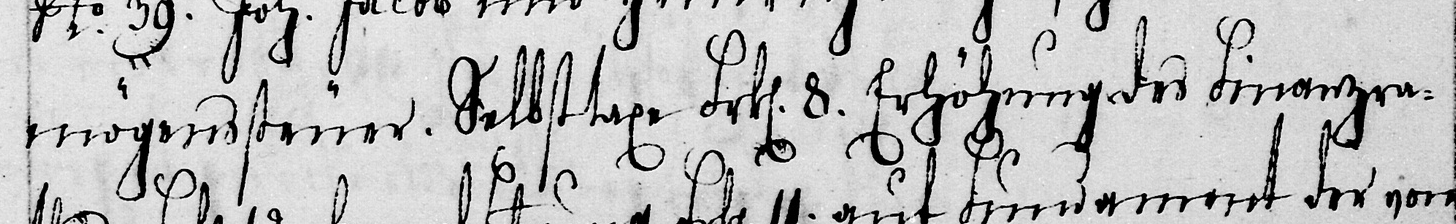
mögenssteuer. Selbsttaxe Frk[en]. 8. Erhöhung des Finanzrat¬
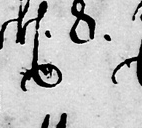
11.
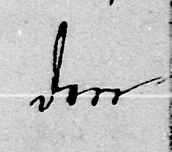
der
